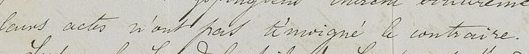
leurs actes n'ont pas témoigné le contraire.
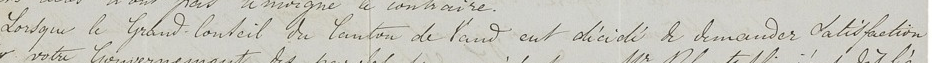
Lorsque le Grand-Conseil du Canton de Vaud eut décidé de demander satisfaction
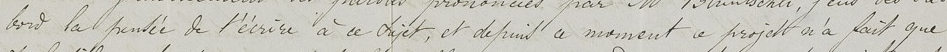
bord la pensée de t'écrire à ce sujet, et depuis ce moment ce projet n'a fait que
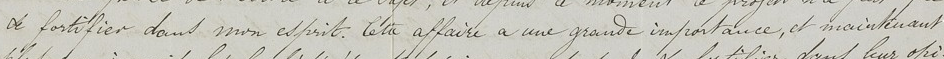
de fortifier dans mon esprit. Cette affaire a une grande importance, et maintenant
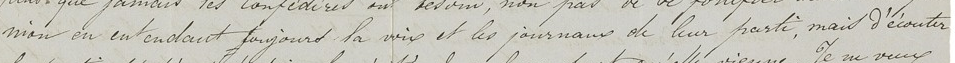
nion en entendant toujours la voix et les journaux de leur parti, mais d'écouter
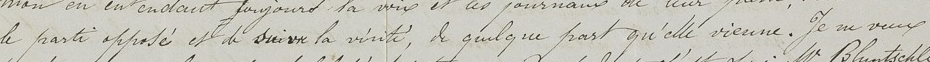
le parti opposé et de suivre la vérité, de quelque part qu'elle vienne. Je ne veux
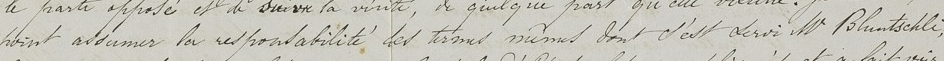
point assumer la responsabilité des termes mêmes dont s'est servi MrBluntschli;
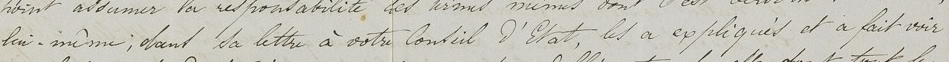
lui-même, dans sa lettre à votre Conseil d'Etat, les a expliqués et a fait voir
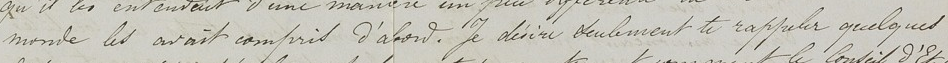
monde les avait compris d'abord. Je désire seulement te rappeler quelques
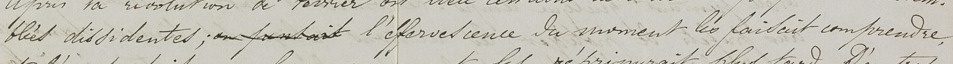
blées dissidentes; on pensait l'effervescence du moment les faisait comprendre,
